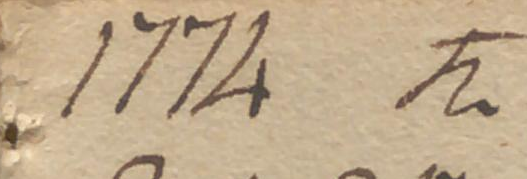1774
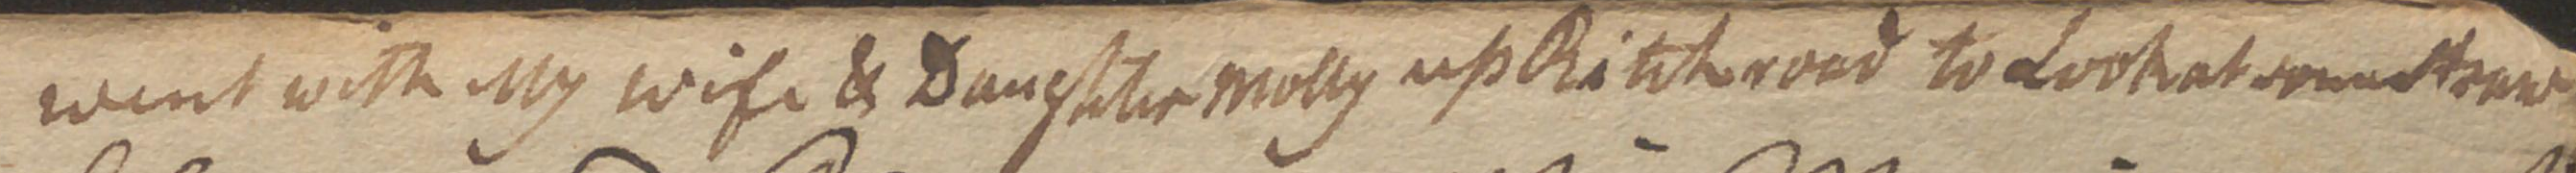went with My wife & Daughter Molly up Ritch road to Look at some straw
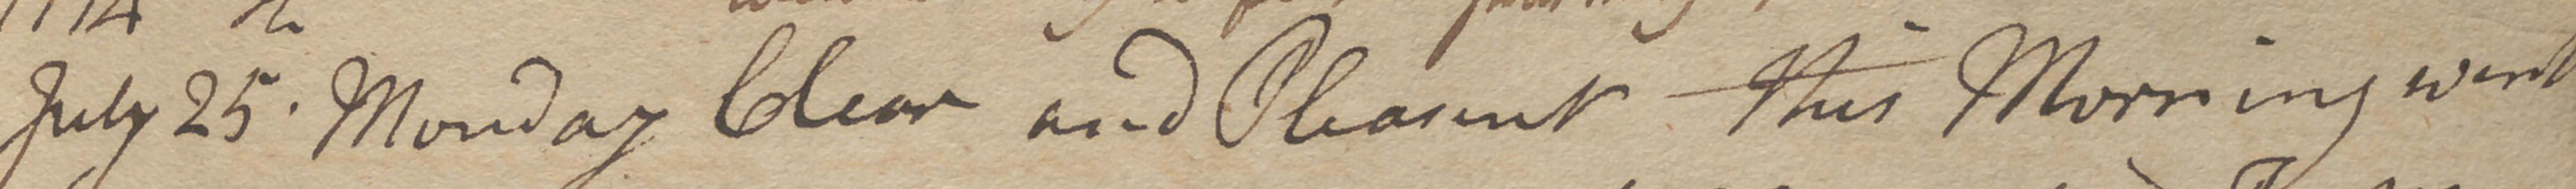July 25^th. Monday Clear and Pleasent this Morning went
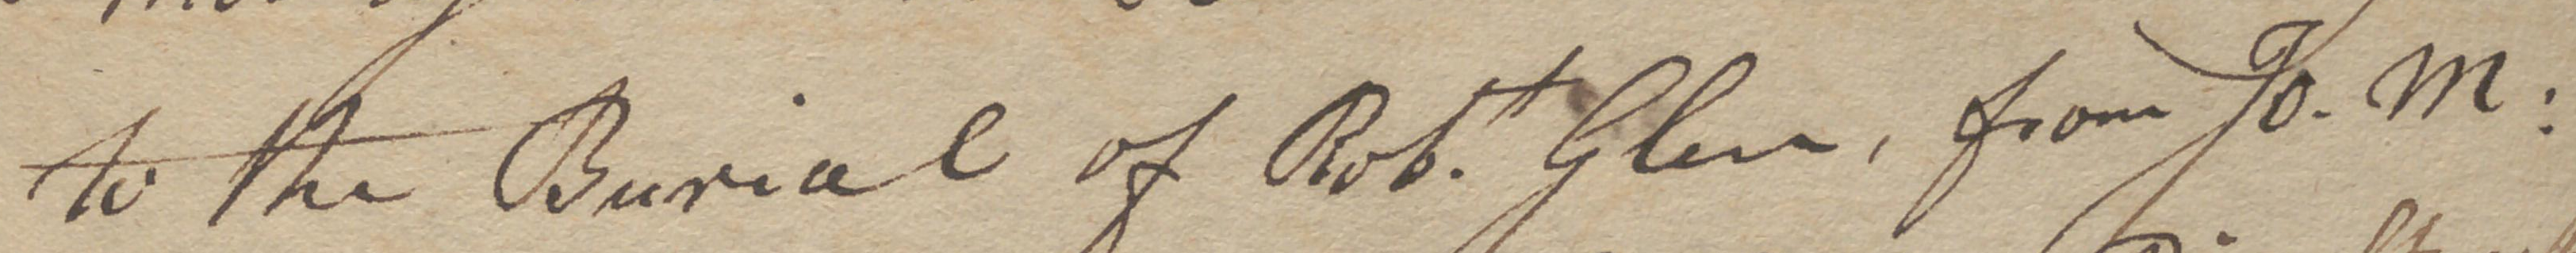to the Burial of Rob^t. Glen, from Jo. M.
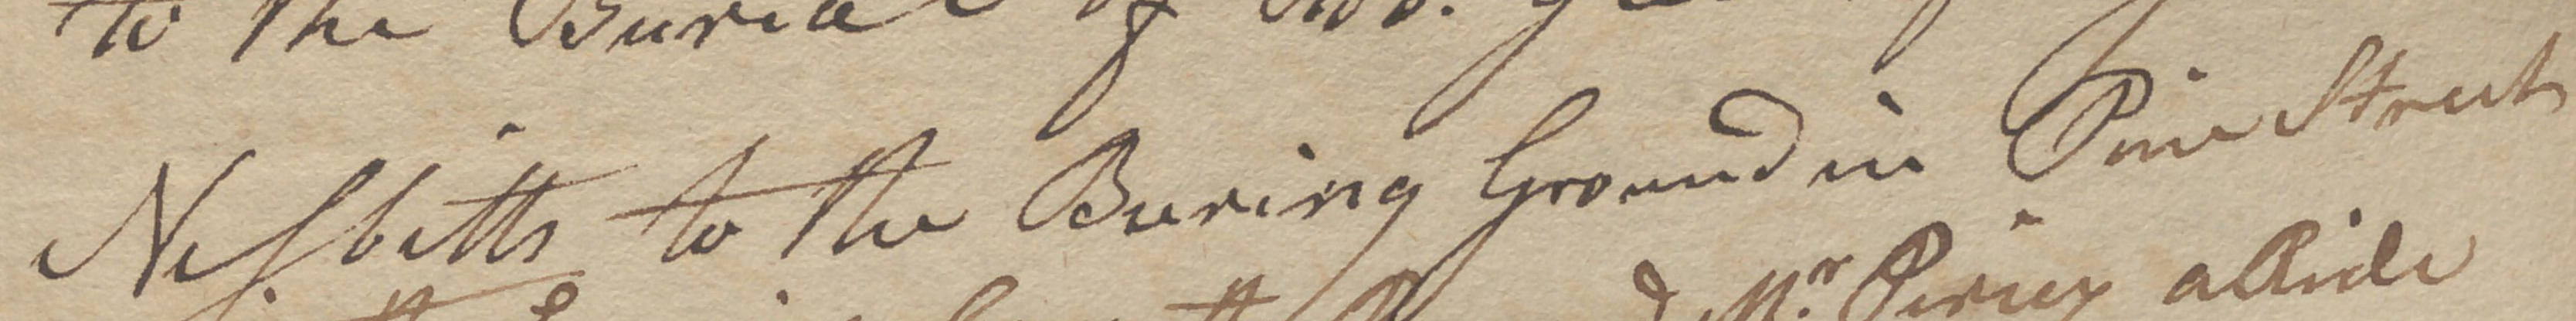Nesbitts to the Buring Ground in Pine Street
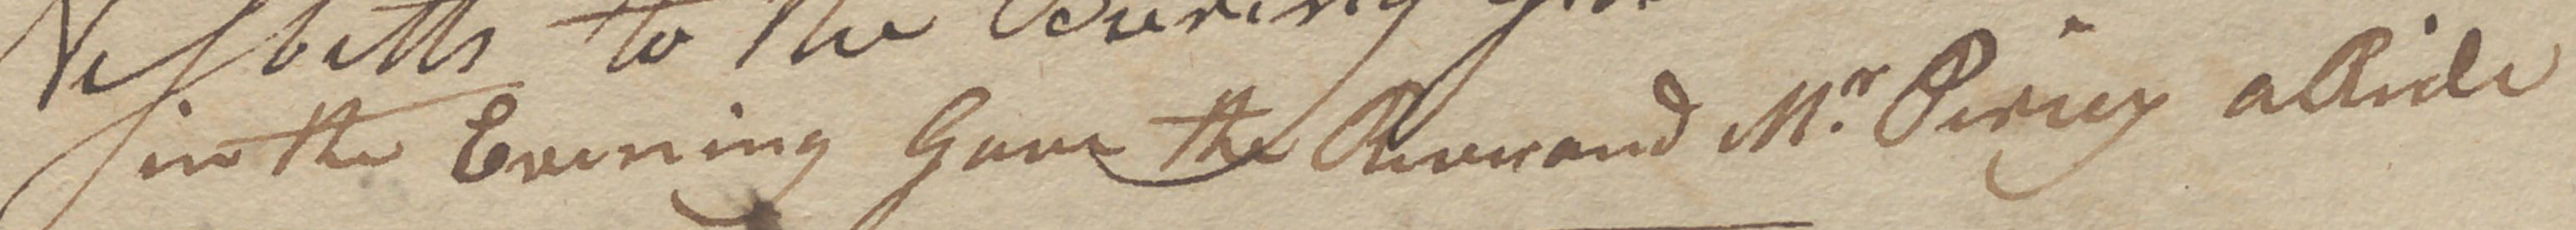in the Evening Gave the Reverand M^r. Pircey a Ride
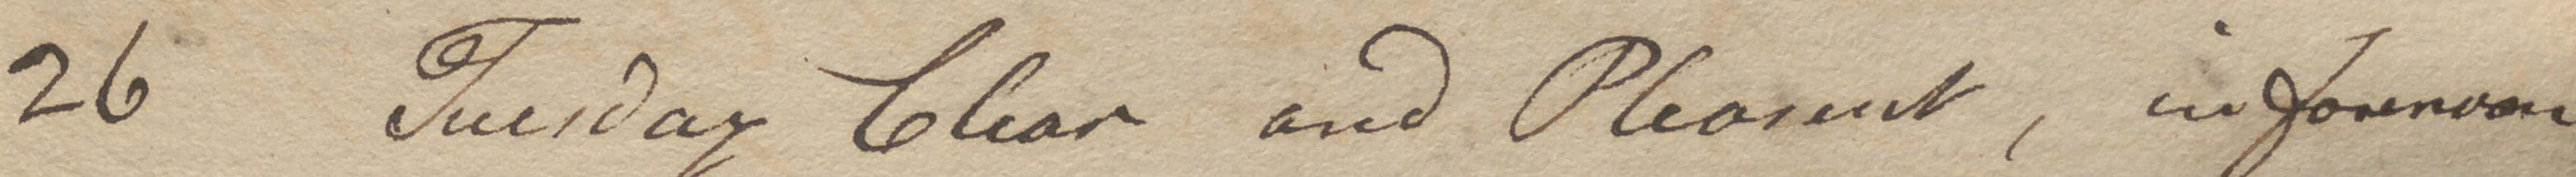26 Tuesday Clear and Pleasent, in forenoon
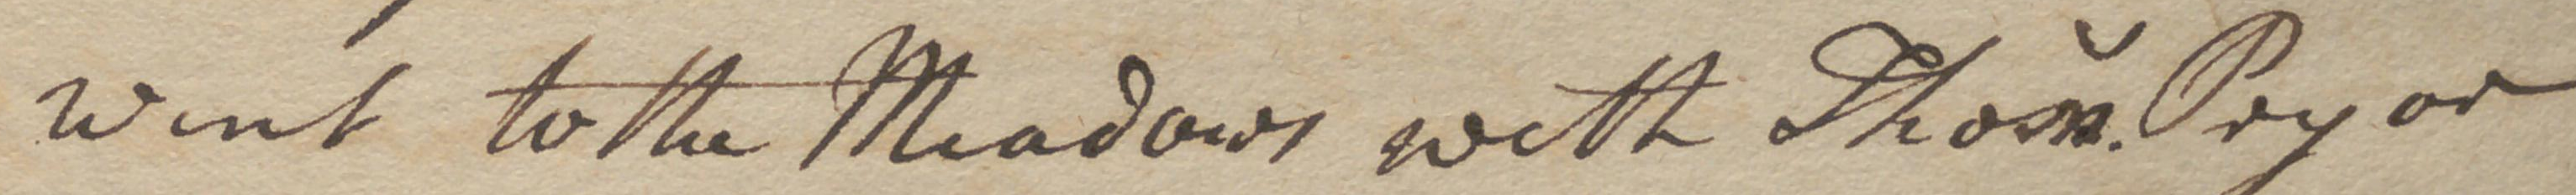went to the Meadows with Thom^s. Pry or
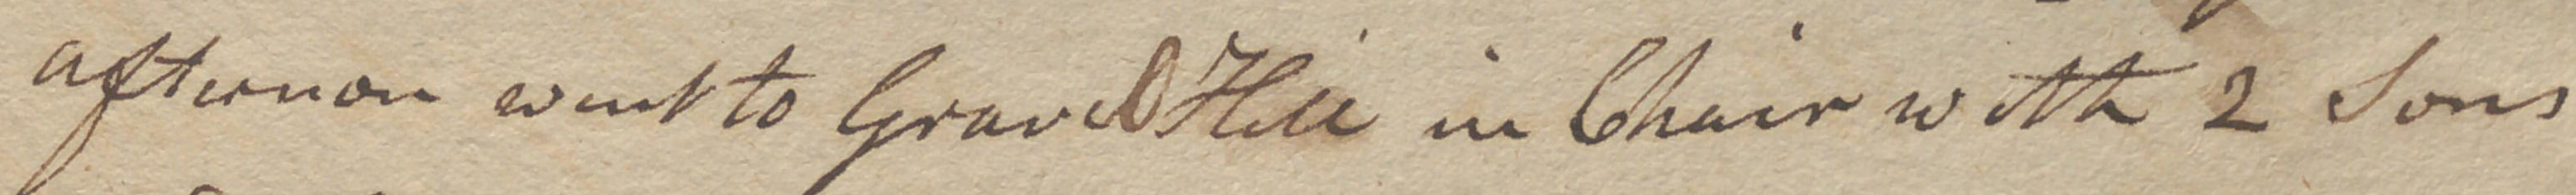afternon went to Gravel Hill in Chair with 2 sons
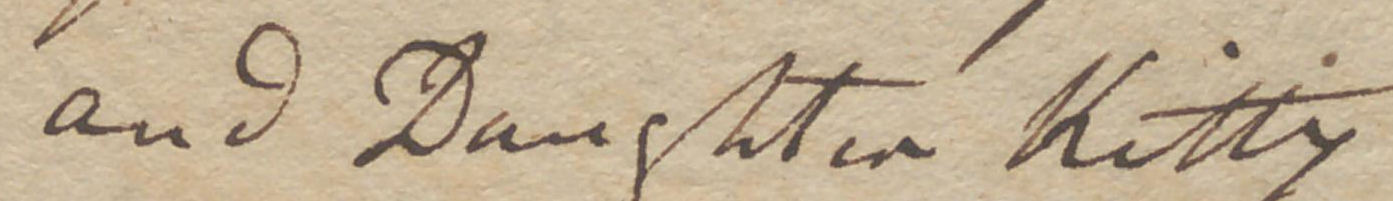and Daughter Kitty
